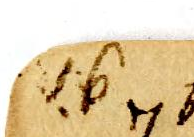16
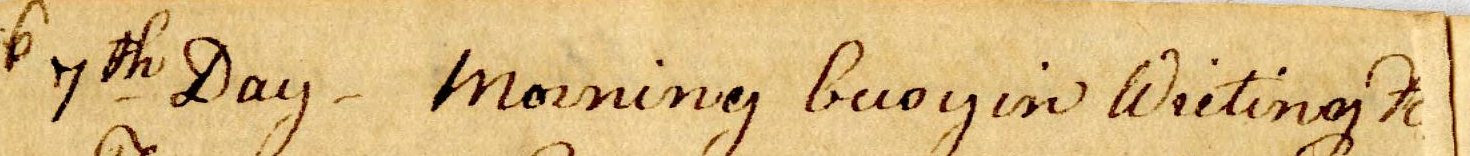7^th Day- morning busy in Writing to
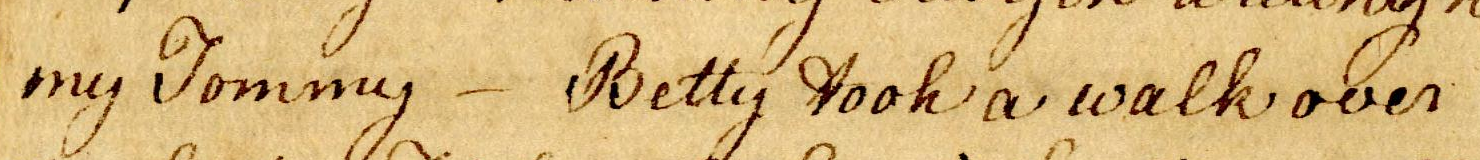my Tommy- Betty took a walk over
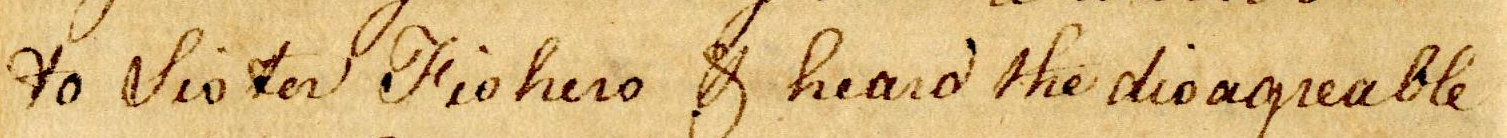to Sister Fishers & heard the disagreable
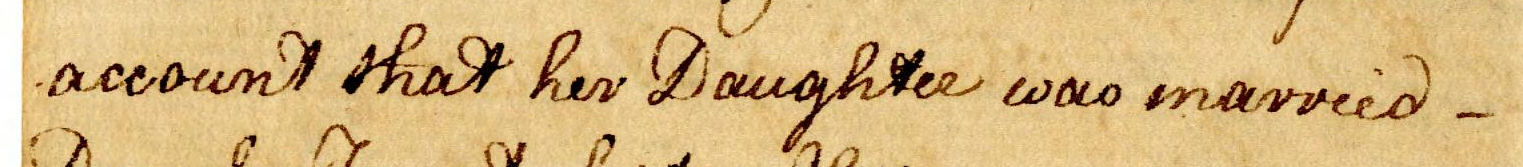account that her Daughter was married-
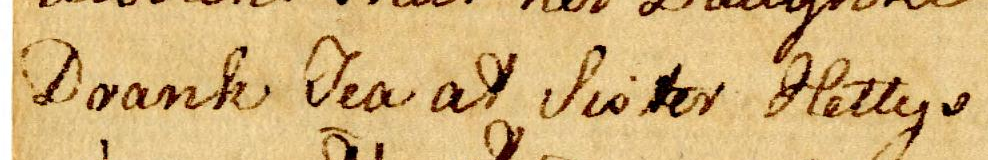Drank Tea at Sister Hettys
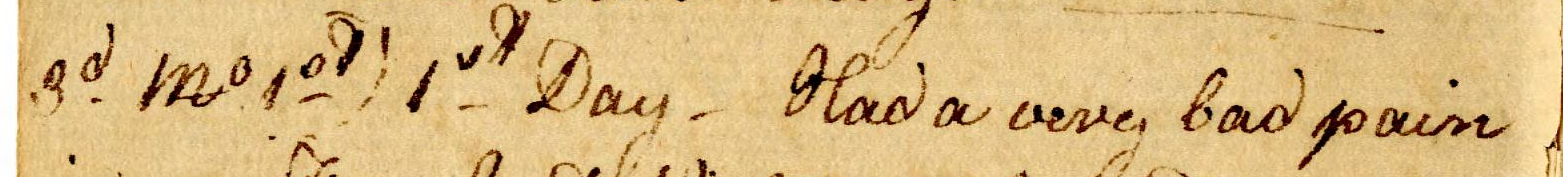3^d M^o 1^st) 1^st Day- Had a very bad pain
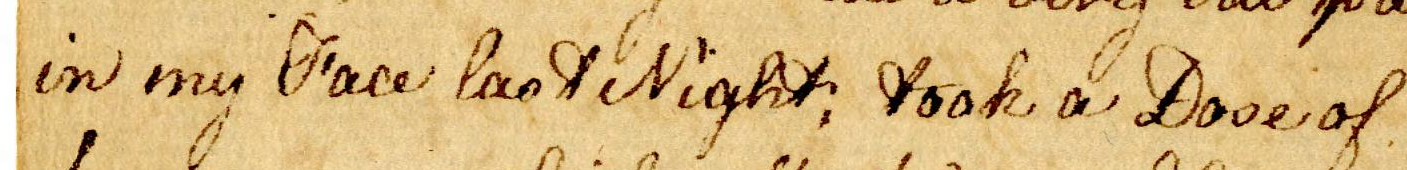in my Face last Night, took a Dose of
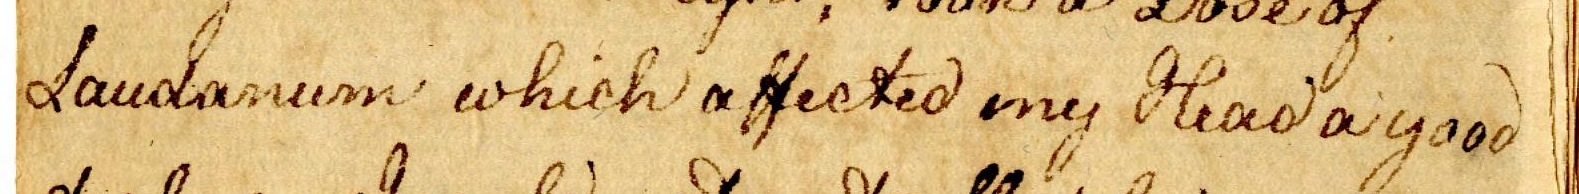Laudanum which affected my Head a good
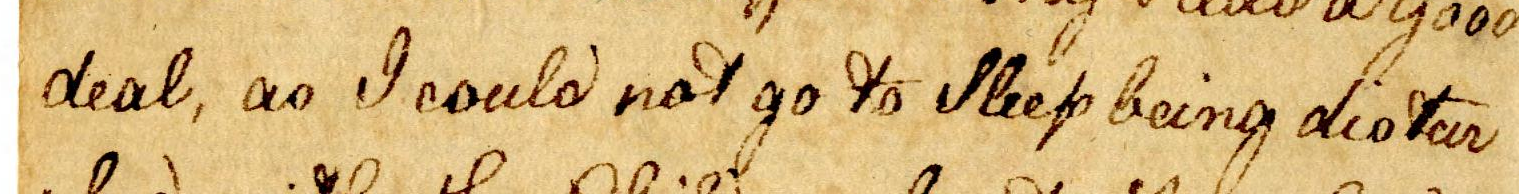deal, as I could not go to Sleep being distur
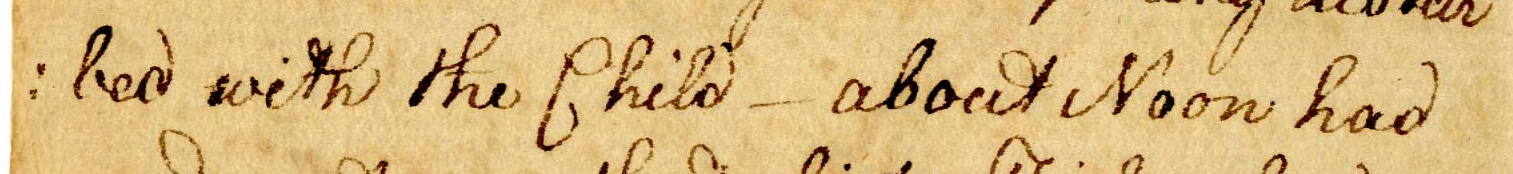-bed with the Child- about Noon had
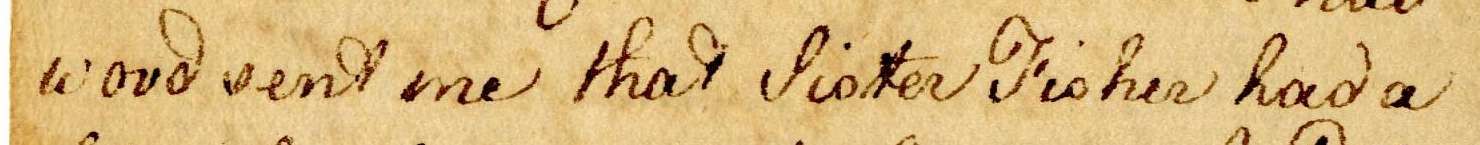word sent me that Sister Fisher had a
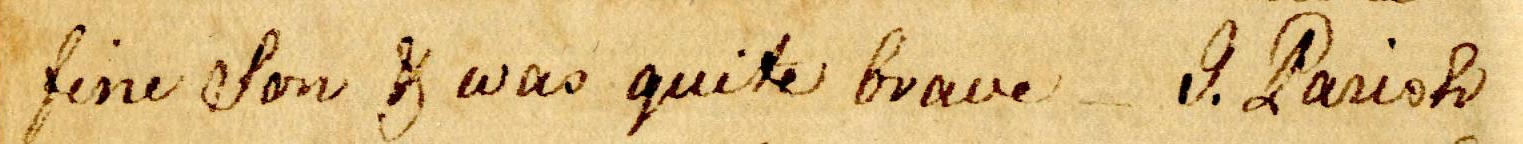fine Son & was quite brave- I. Parish
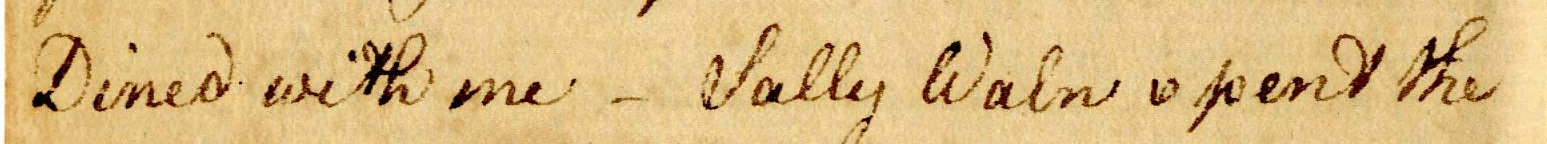Dined with me- Sally Waln spent the
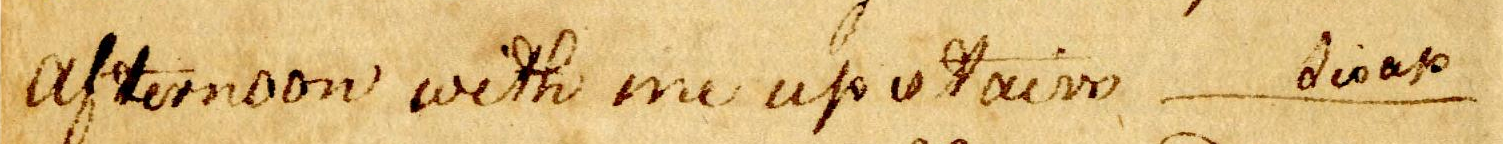Afternoon with me up stairs- disap
